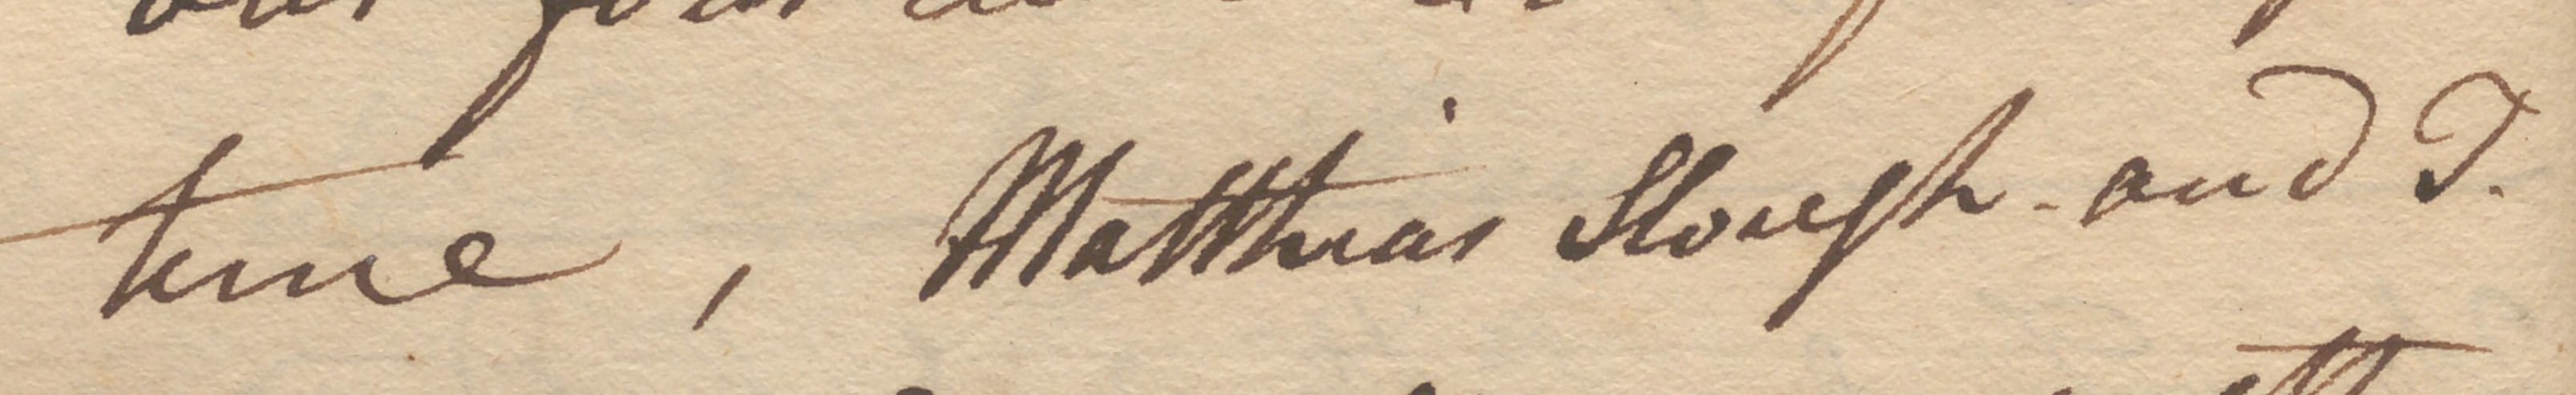Time, Matthias Slough and T.
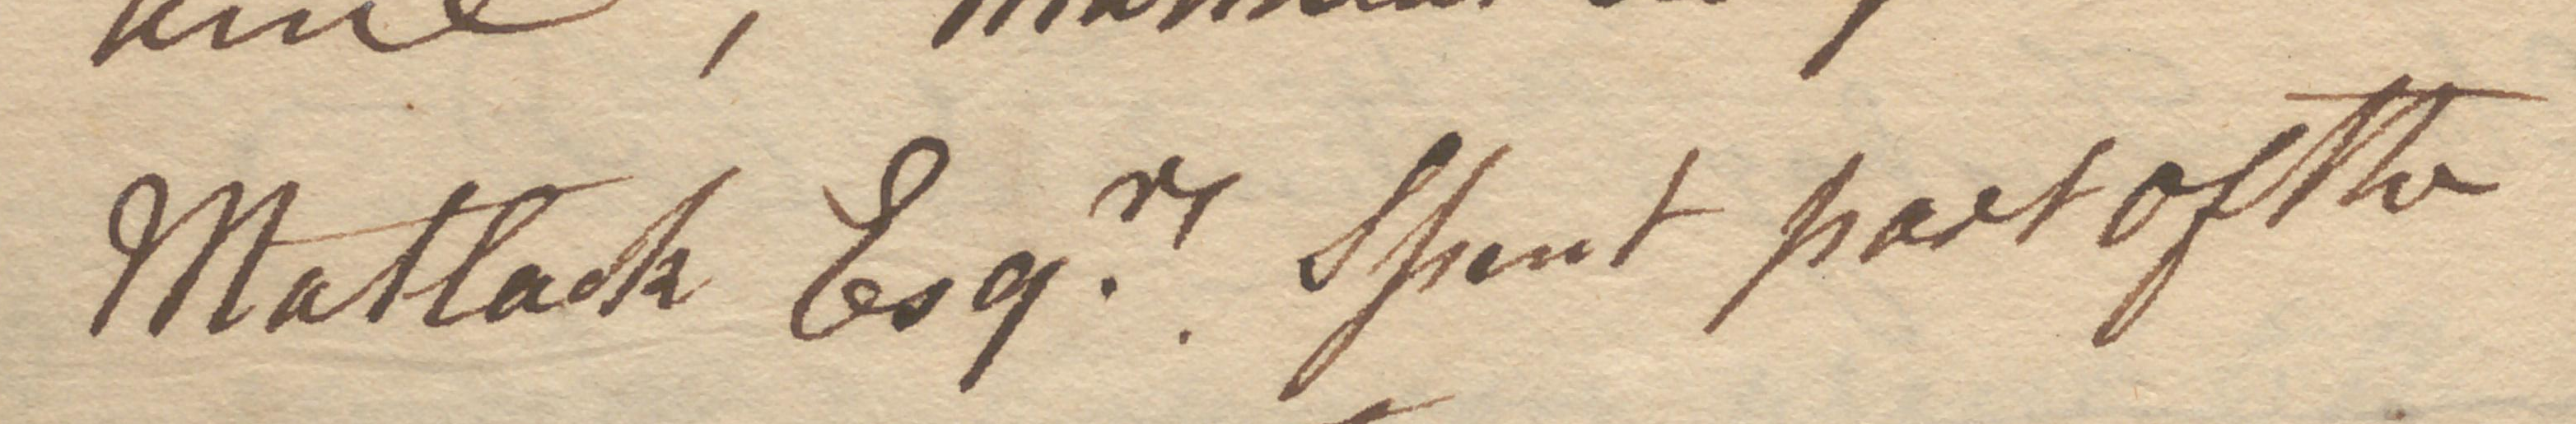Matlack Esq^r. Spent part of the
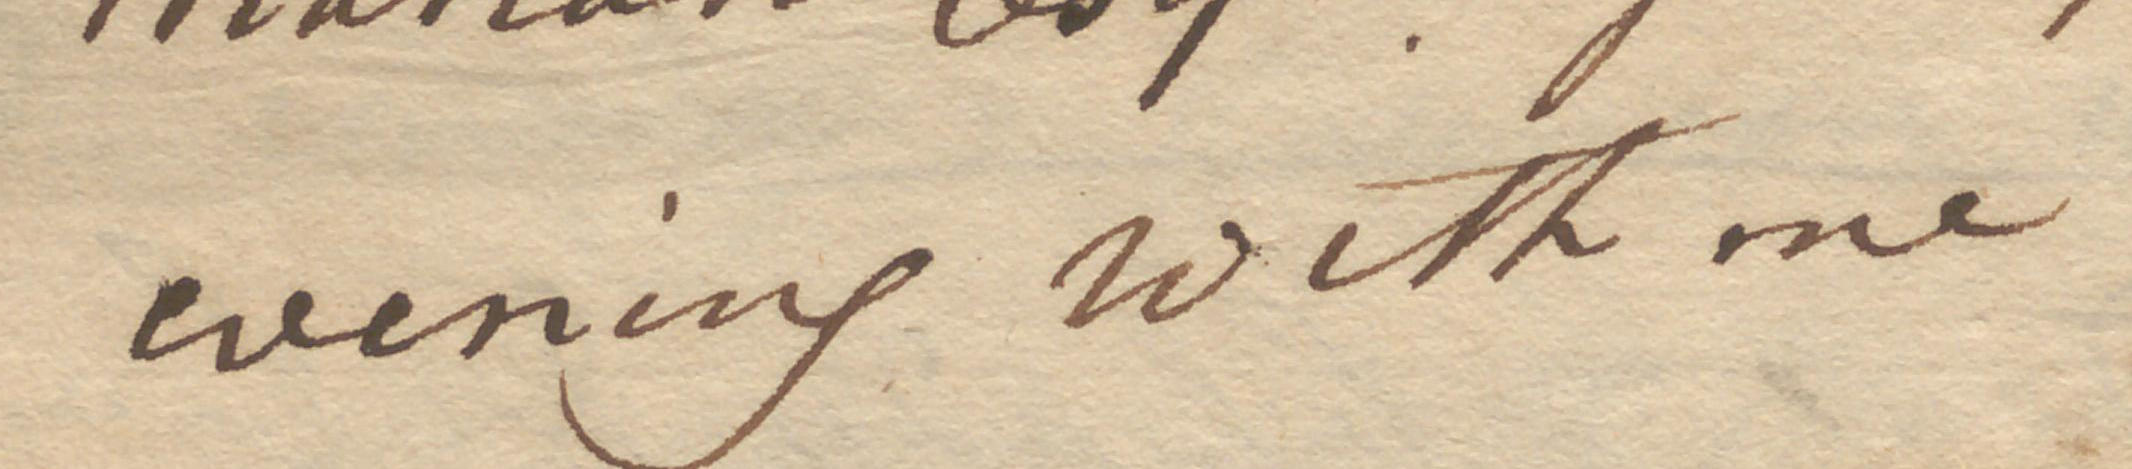evening with me
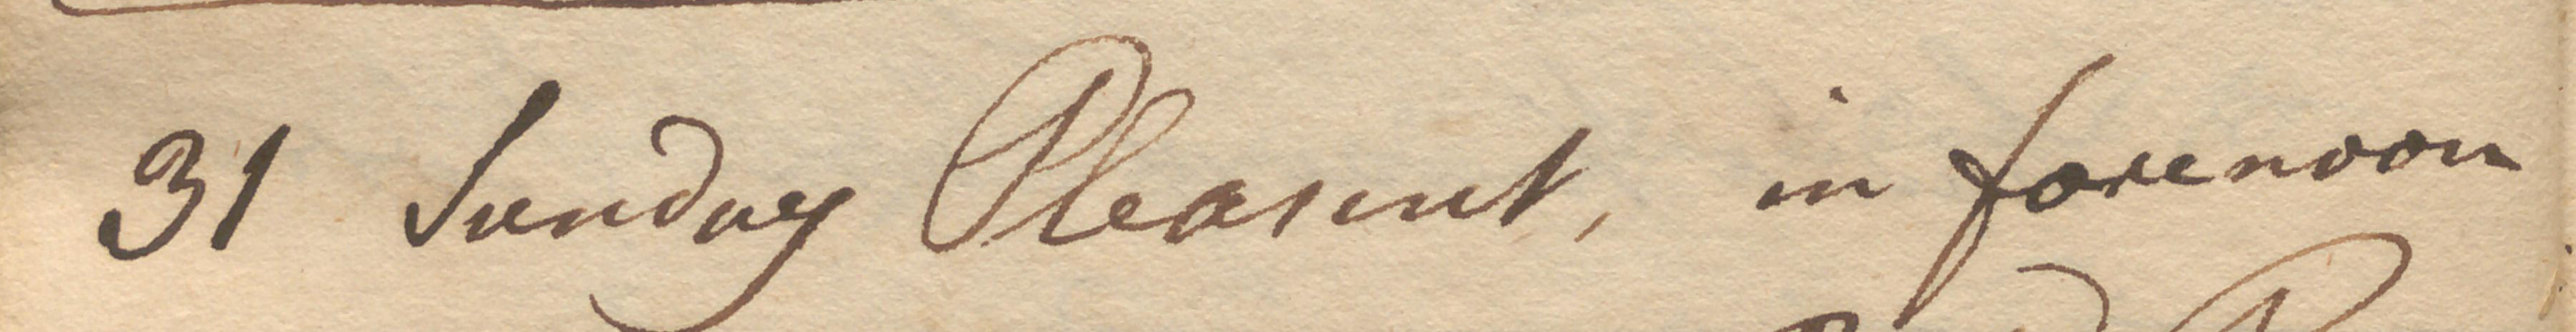31 Sunday Pleasent, in forenoon
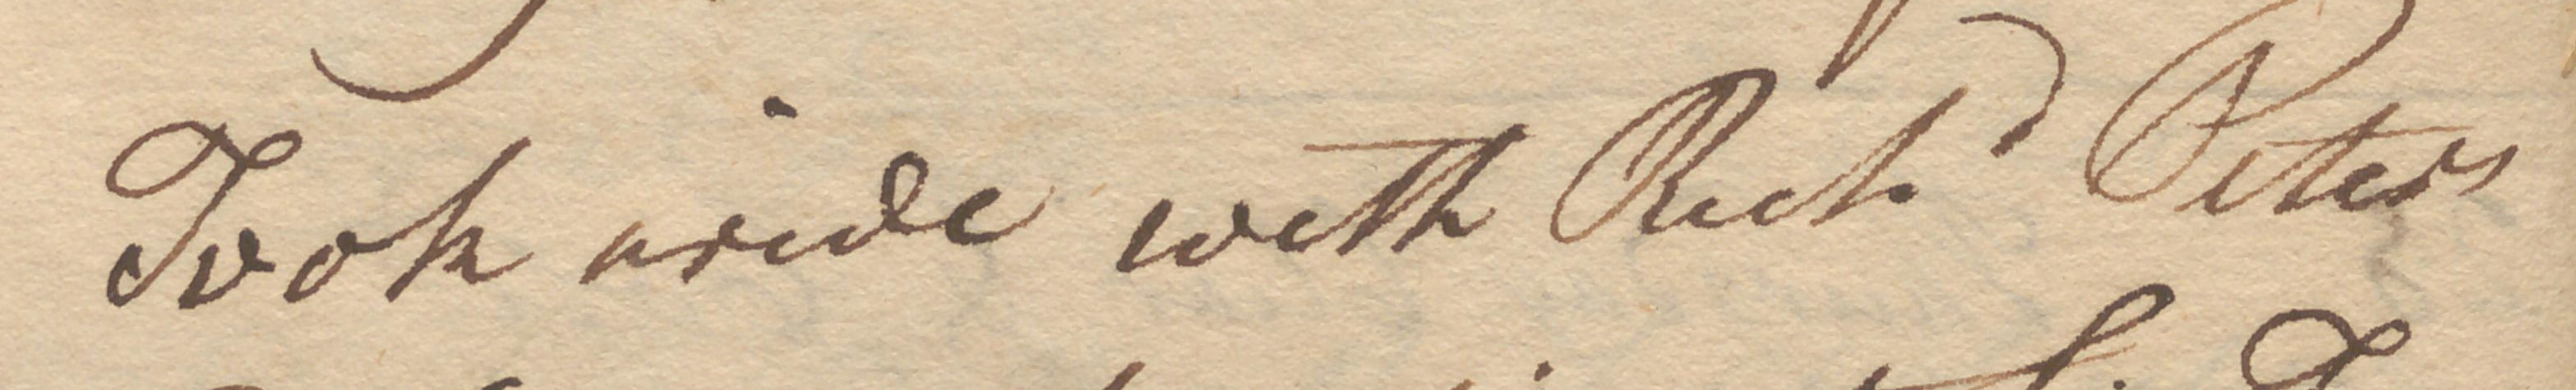Took a ride with Rich^d Peters
